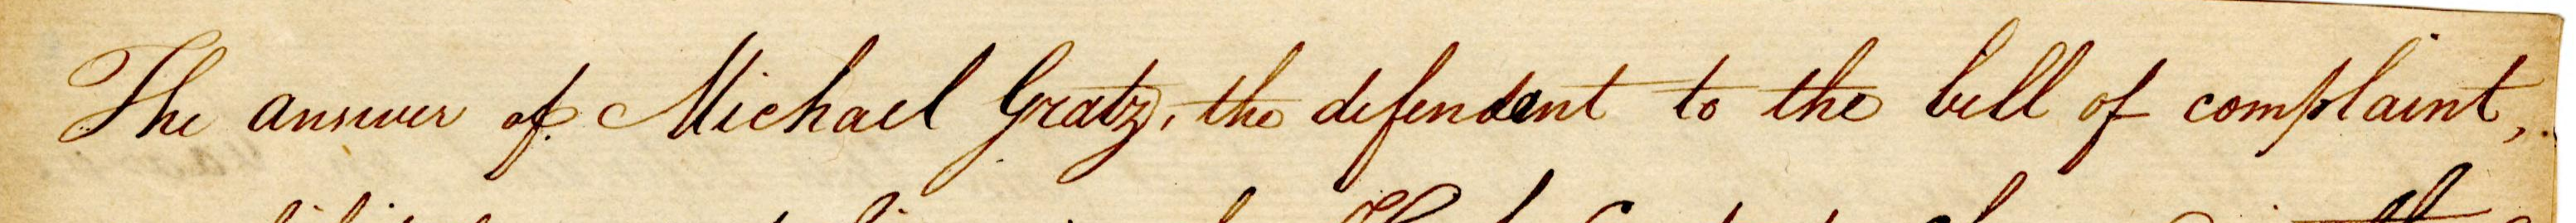The answer of Michael Gratz; the defendent to the bill of complaint
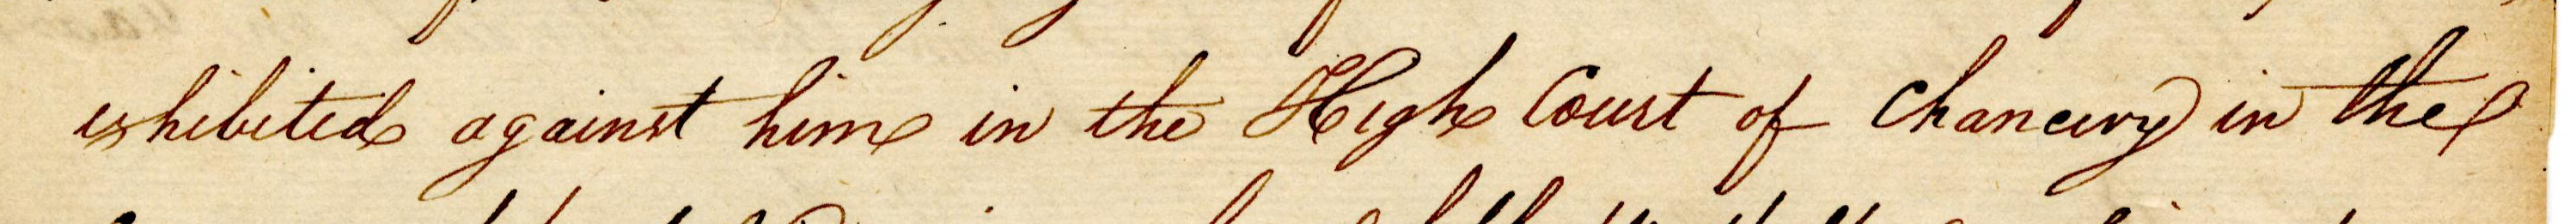exhibited against him in the Highs Court of Chancery in the
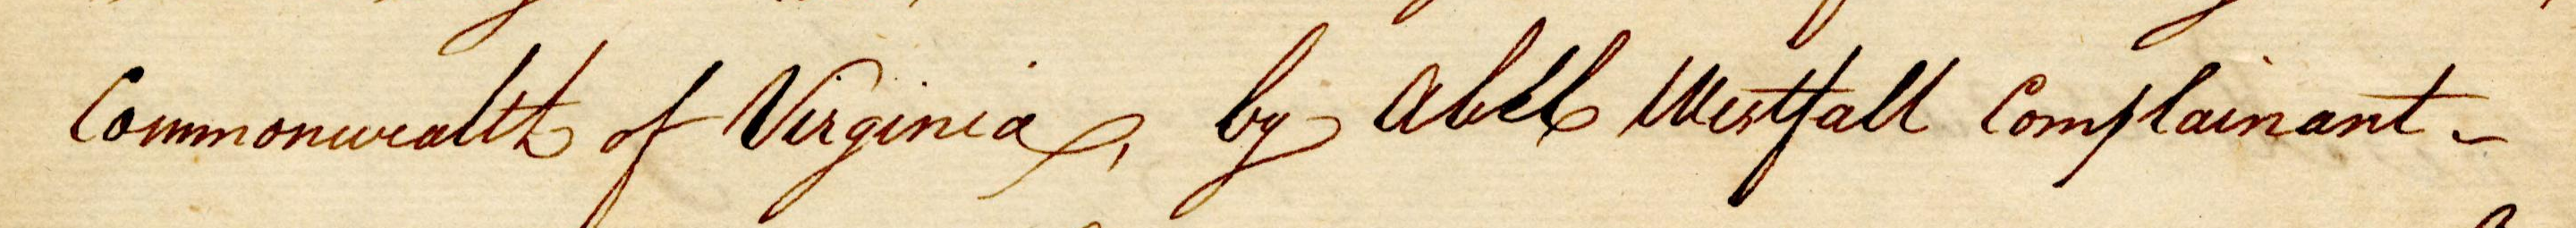Commonwealth of Virginia, by Abel Westfall Complainant-
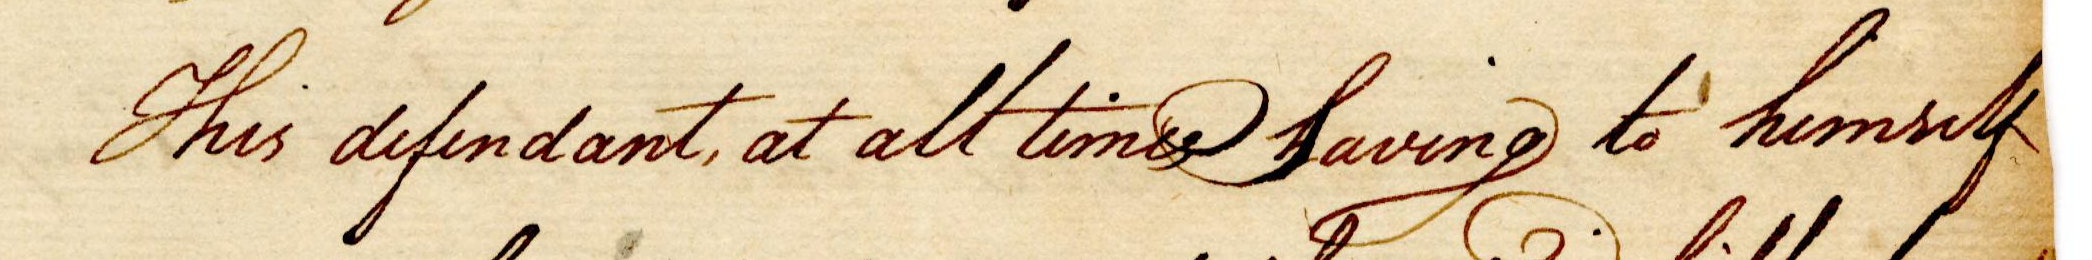This defendant at all time saving to himself
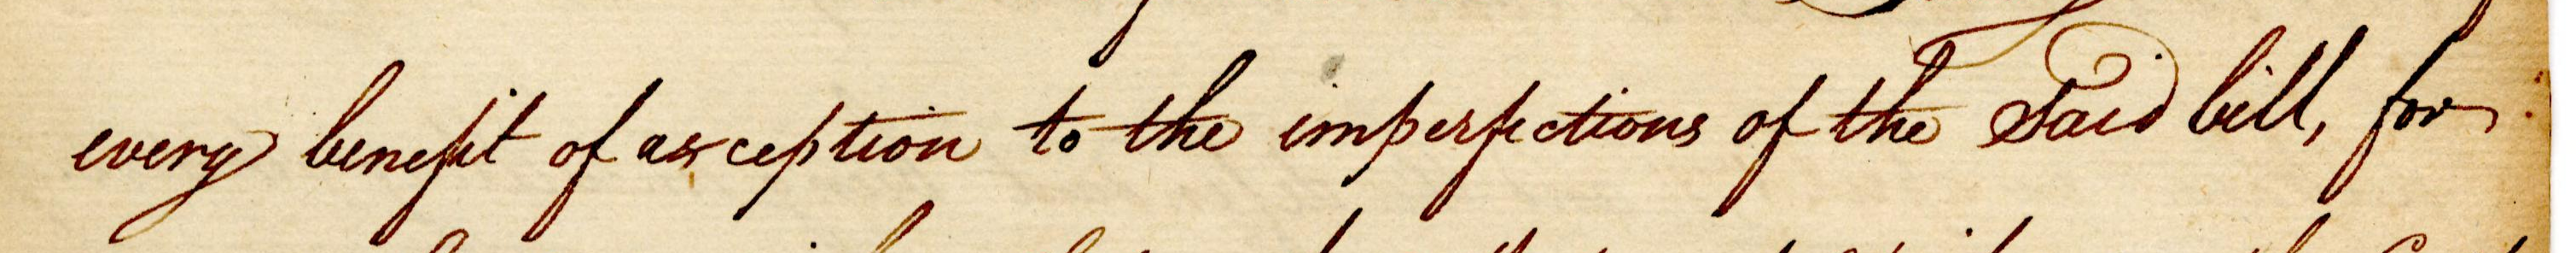every benefit of exception to the imperfections of the said bill for
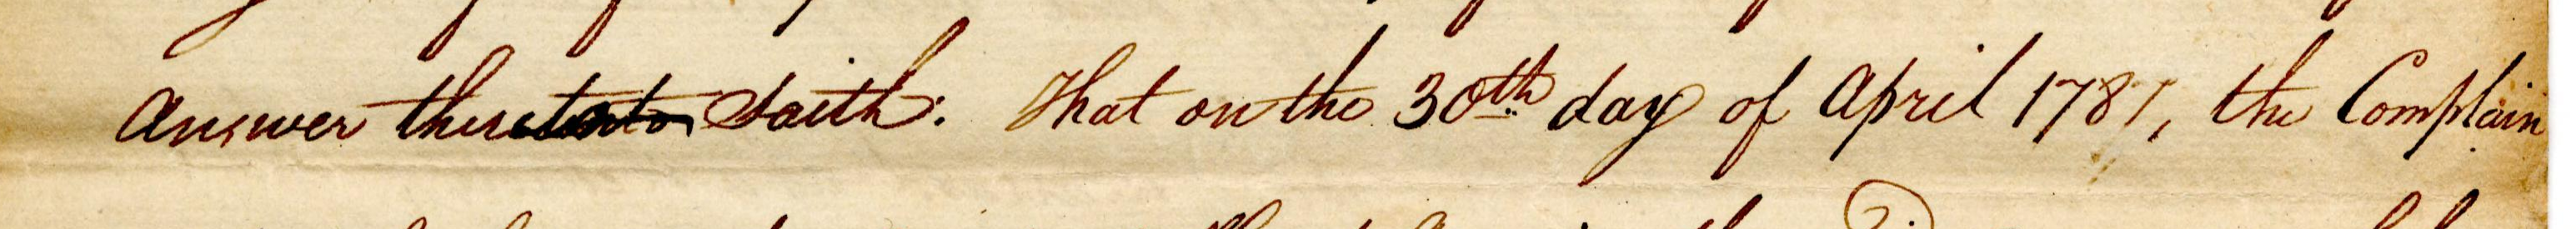Answer this [state] saith. That on the 30^th day of April 1781, the Complain-
